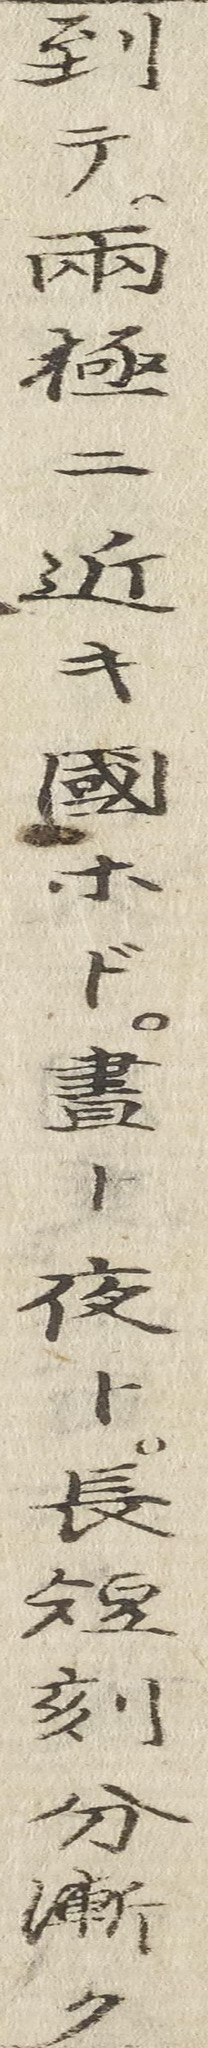到テ。両極ニ近キ国ホド。昼ト夜ト。長短刻分漸ク
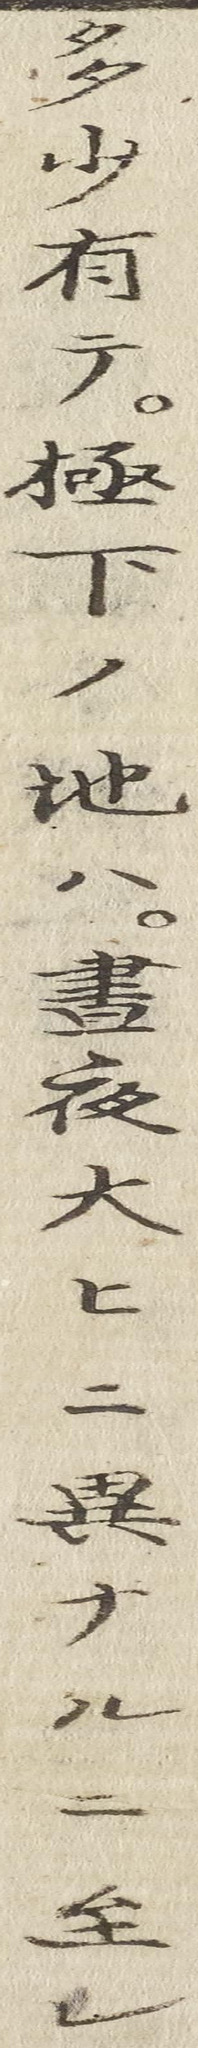多少有テ。極下ノ地ハ。昼夜大ヒニ異ナルニ至レ
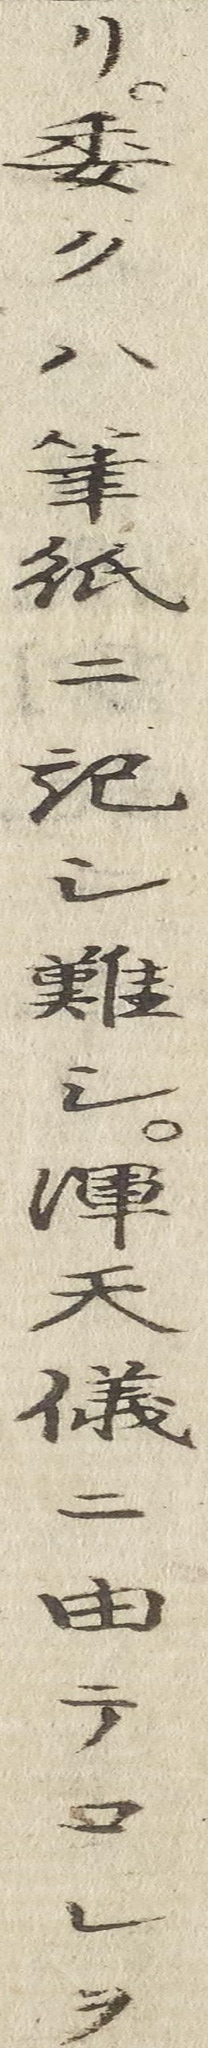リ。委クハ筆紙ニ記シ難シ。渾天儀ニ由テコレヲ
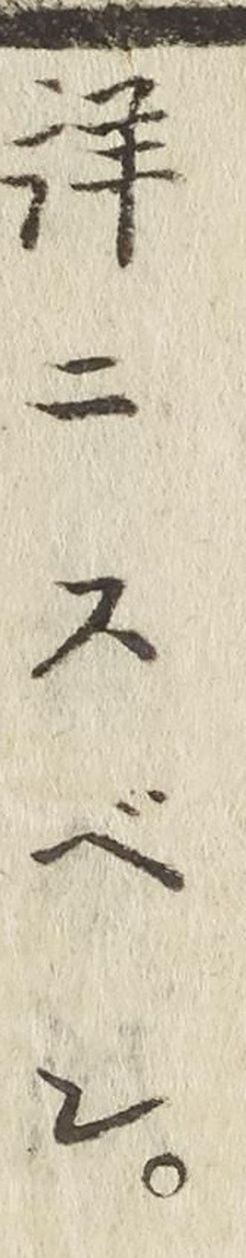詳ニスベシ。
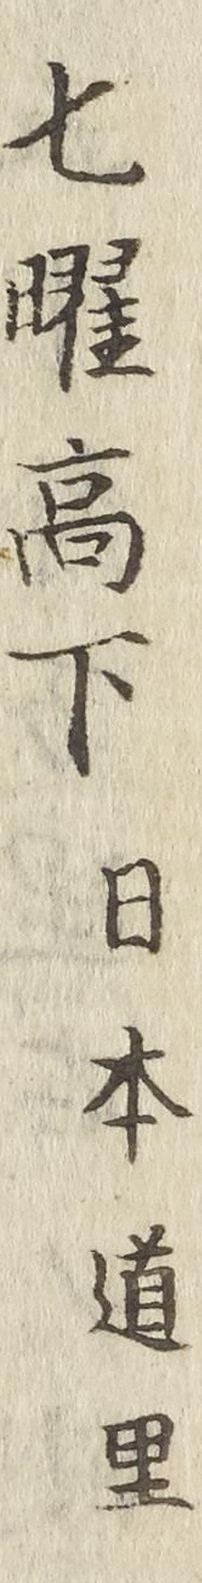七曜高下日本道里
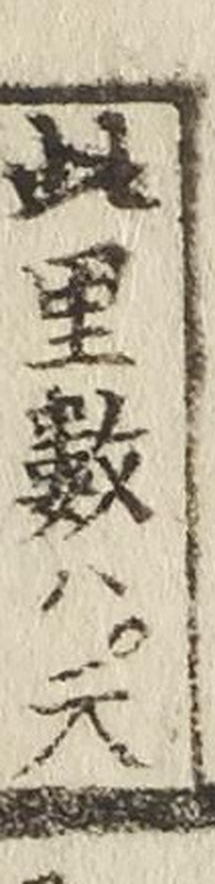此里数ハ。天
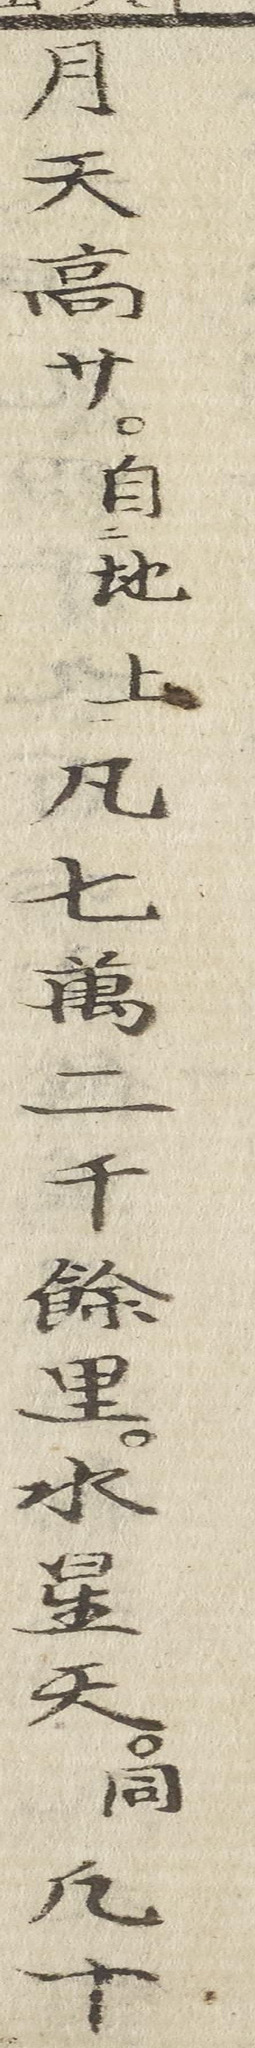月天高サ。自地上凡七万二千余里。水星天。同凡十
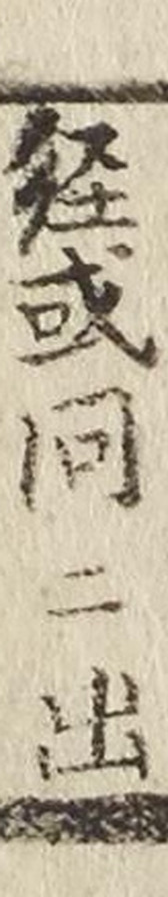径或問ニ出
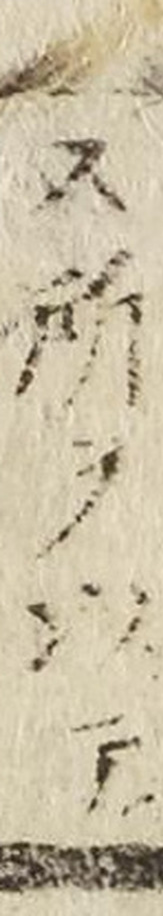ス所ヲ以テ
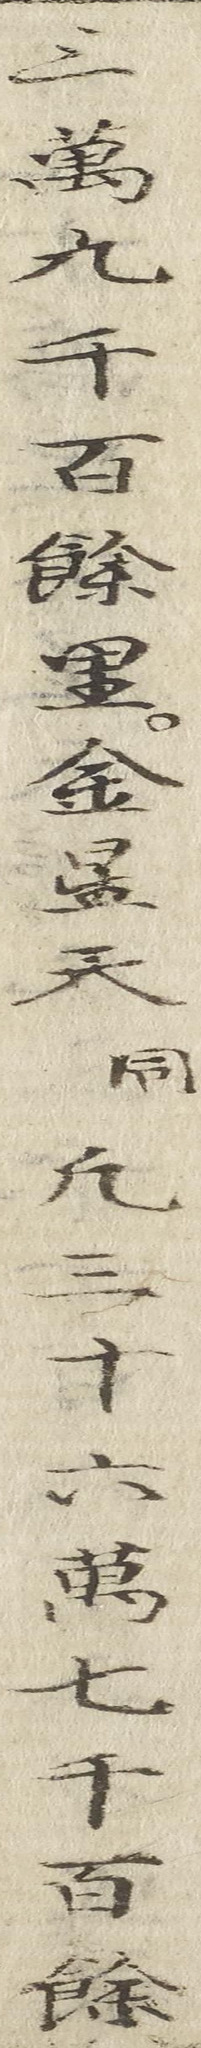三万九千百余里。金星天同凡三十六万七千百余
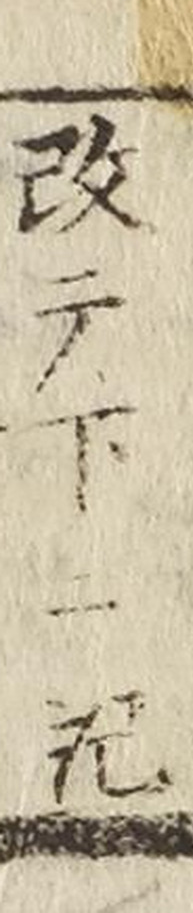改テ下ニ記
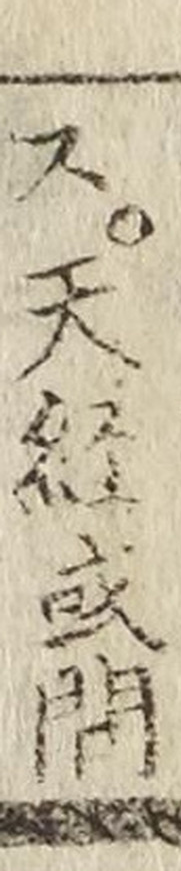ス。天経或問
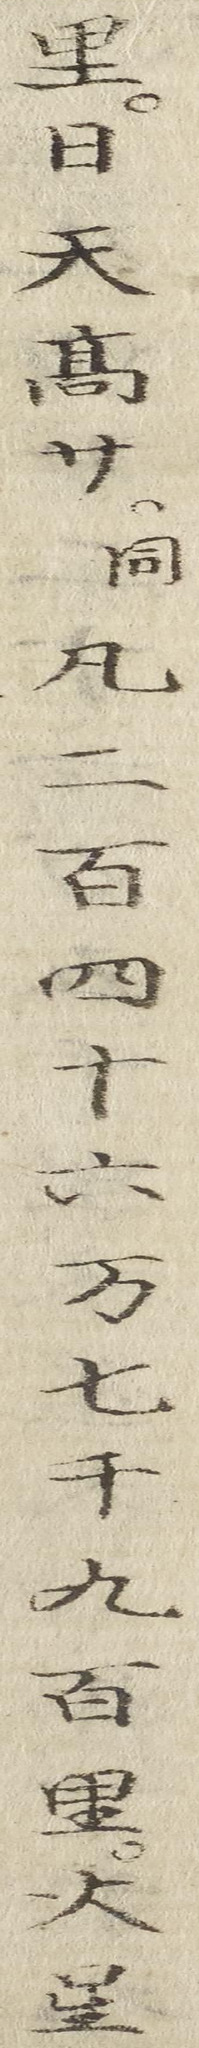里。日天高サ。同凡二百四十六万七千九百里。火星
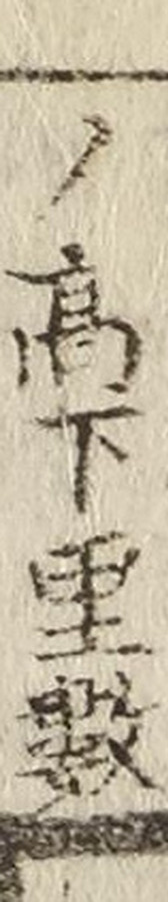ノ高下里数
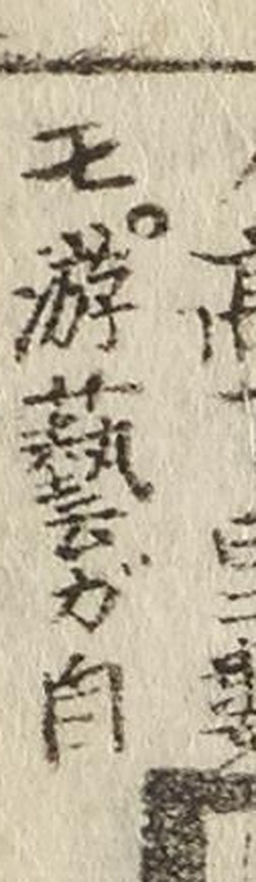モ。遊芸ガ自

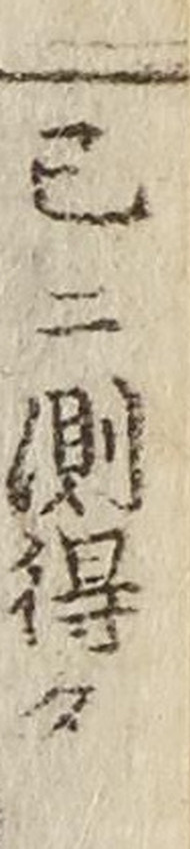己ニ測得タ
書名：大略天学名目鈔　天經或問附録
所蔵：東京大学地震研究所図書室 Earthquake Research Institute Library, The University of Tokyo, JAPAN
